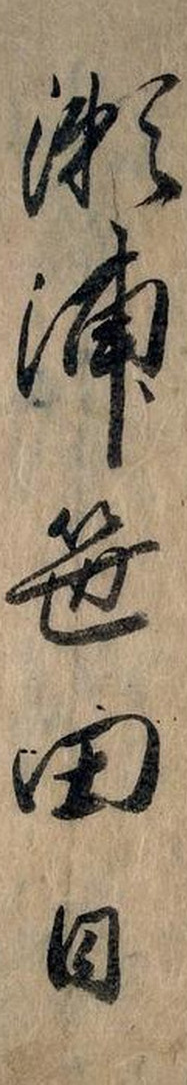瀬浦笹田日
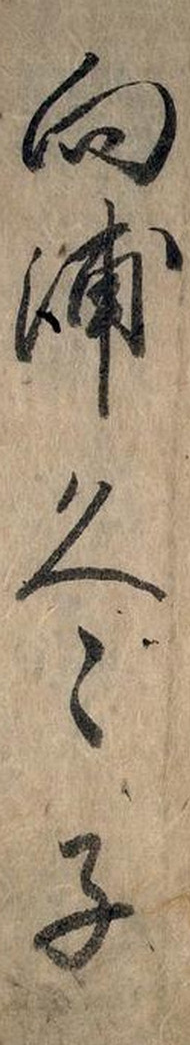向浦久々子

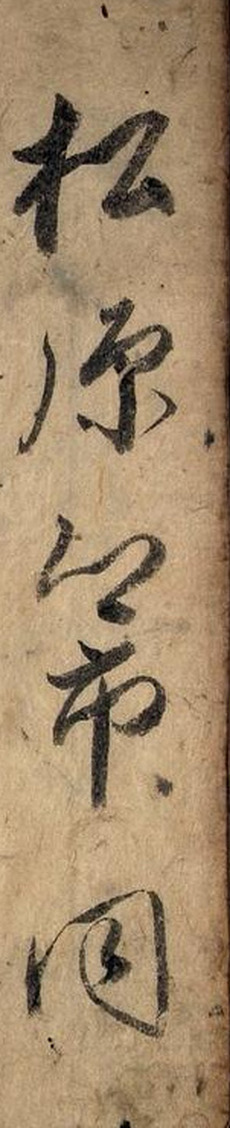松原郷市同
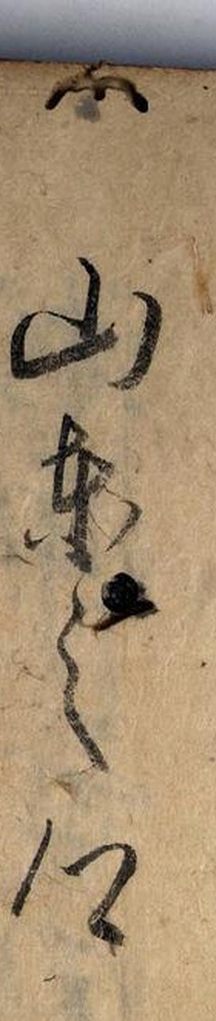山東之郷
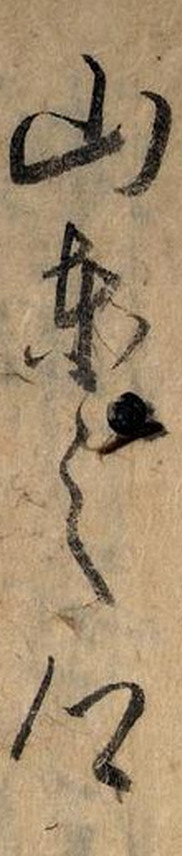山東之郷
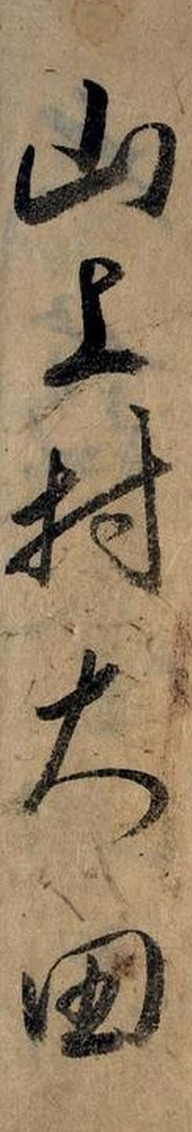山上村大田
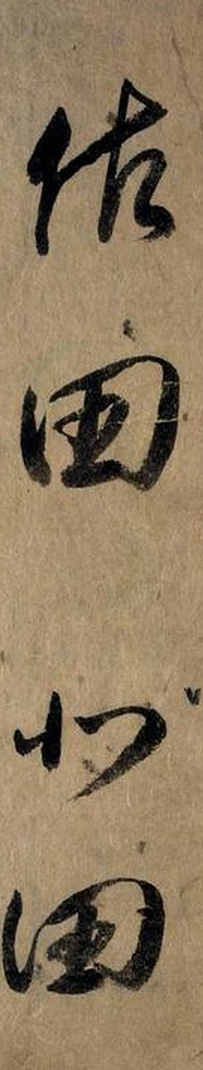佐田北田
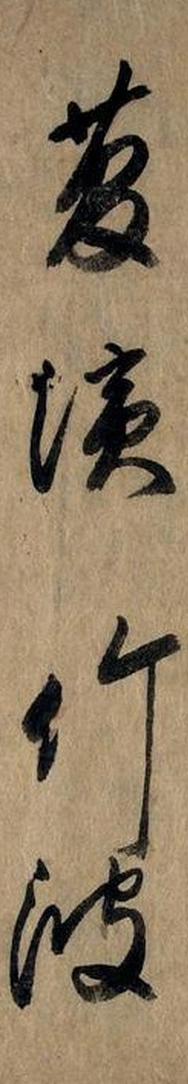菅浜竹波
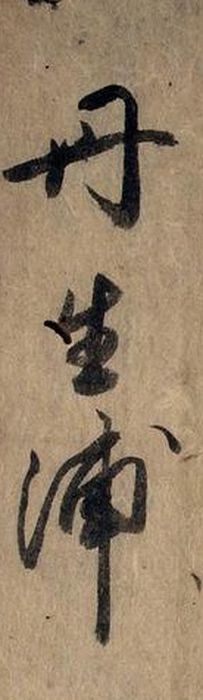丹生浦

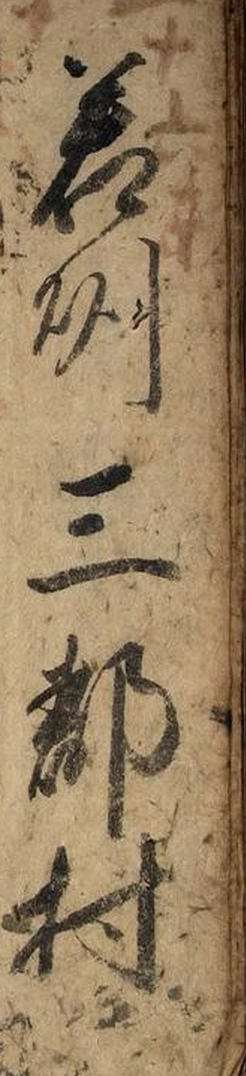若州三郡村
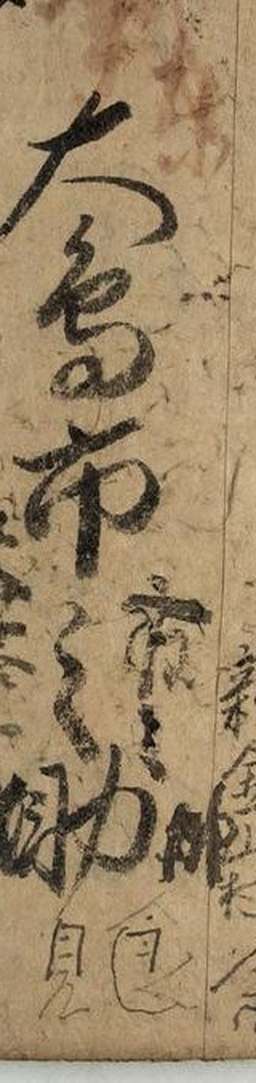大鳥市之助
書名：御手本（手習、家号之事、小浜商家の屋号）
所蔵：福井県文書館 Fukui Prefectural Archives
